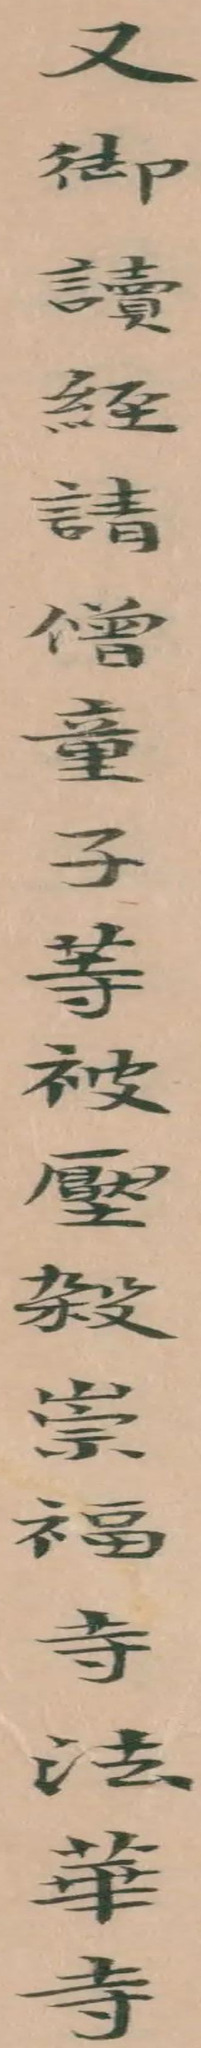又御読経請僧童子等被圧殺祟福寺法華寺
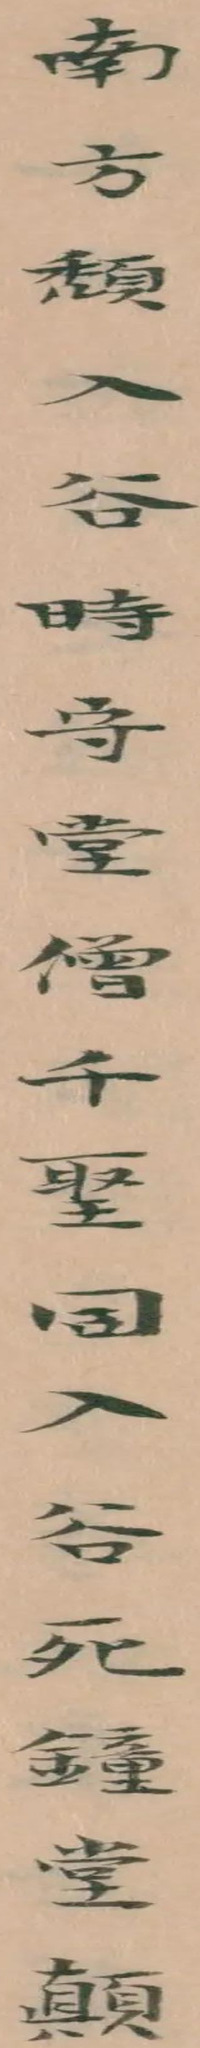南方頽入谷時守堂僧千聖同入谷死鐘堂顛
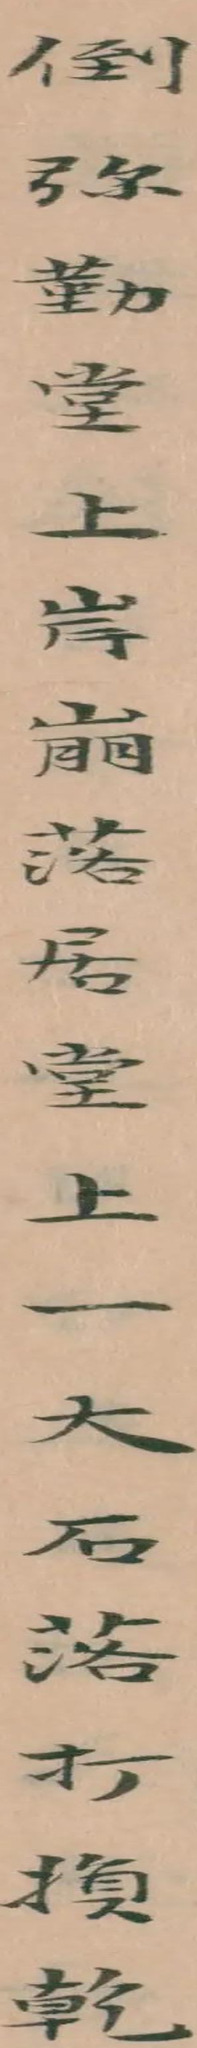倒弥勒堂上岸崩落居堂上一大石落打損乾
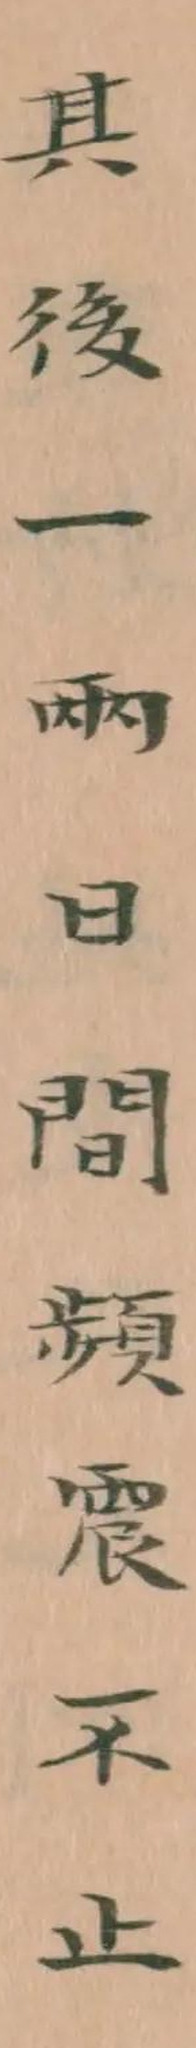其後一両日間頻震不止
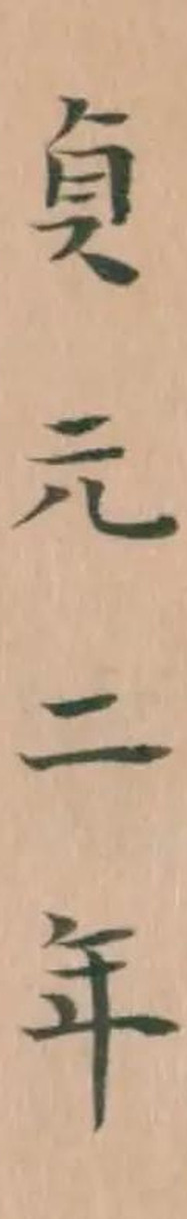貞元二年
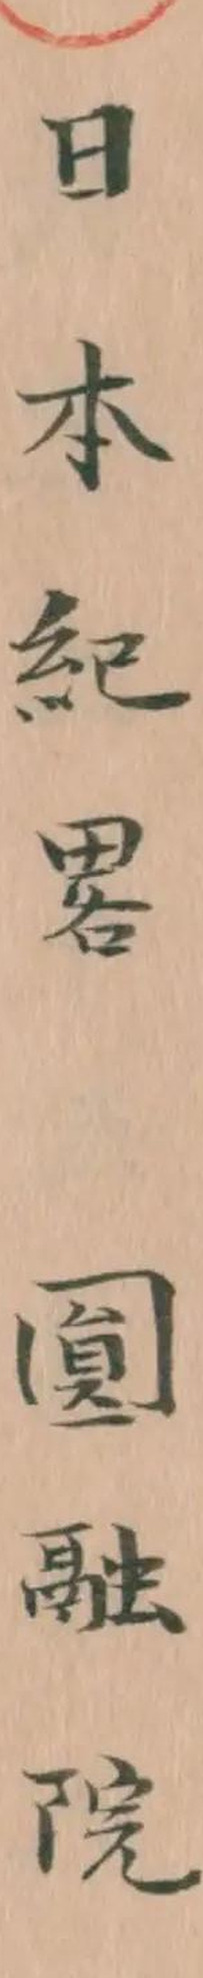○日本紀略円融院
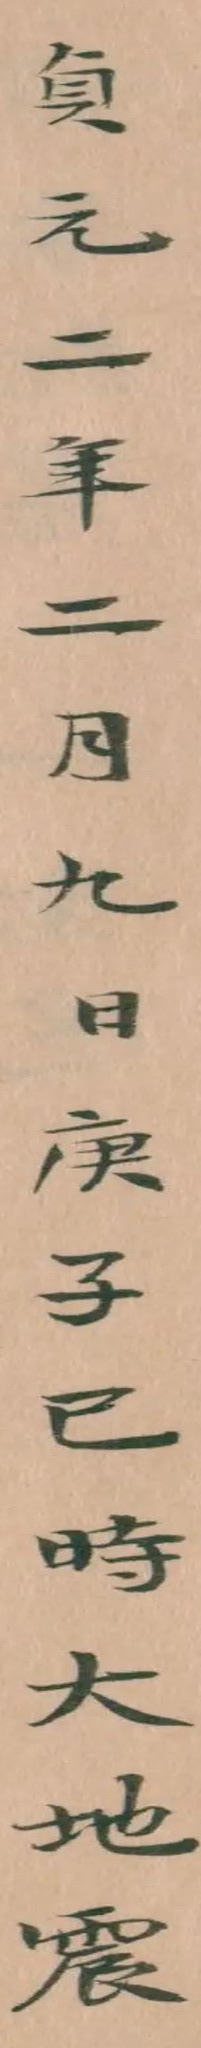貞元二年二月九日庚子巳時大地震
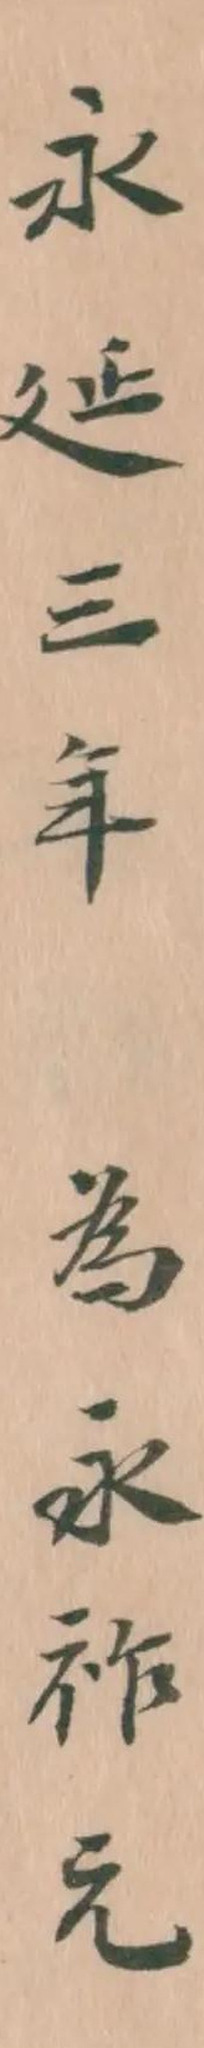永延三年為永祚元

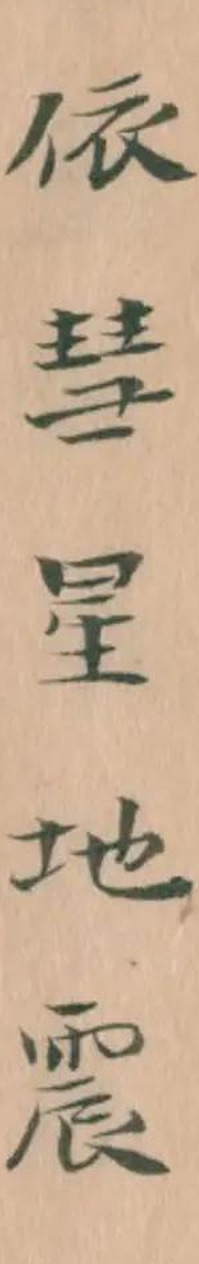依彗星地震
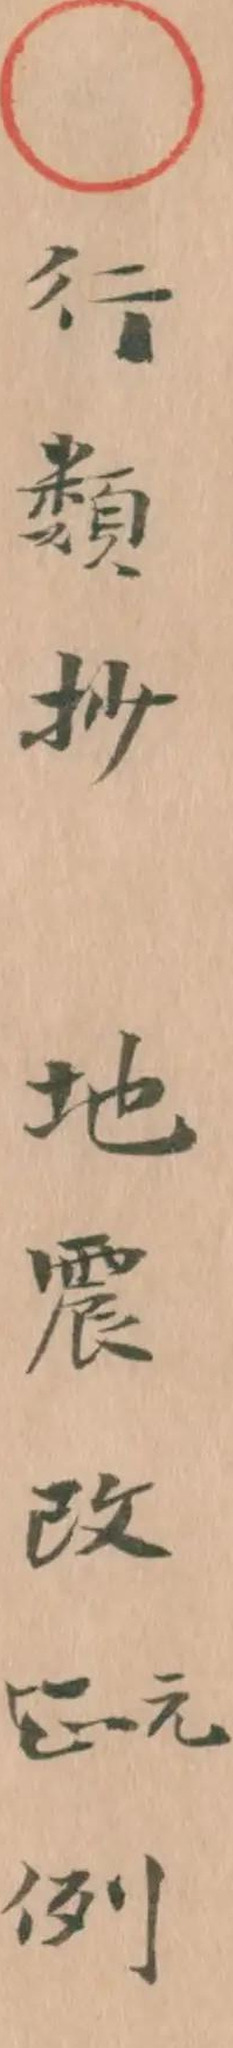○行類抄地震改正例
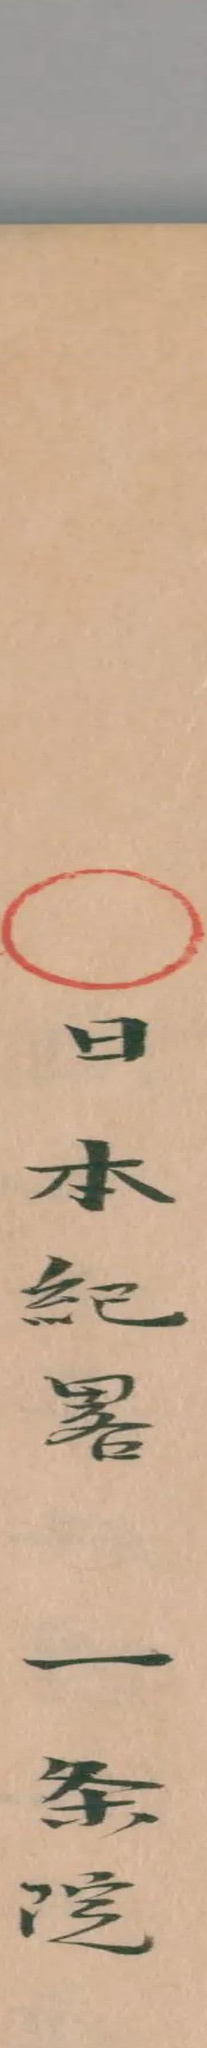○日本紀略一条院
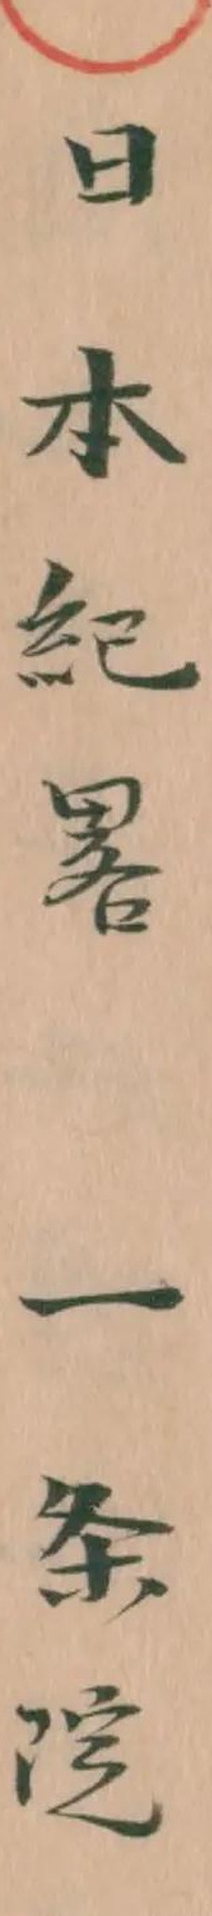○日本紀略一条院
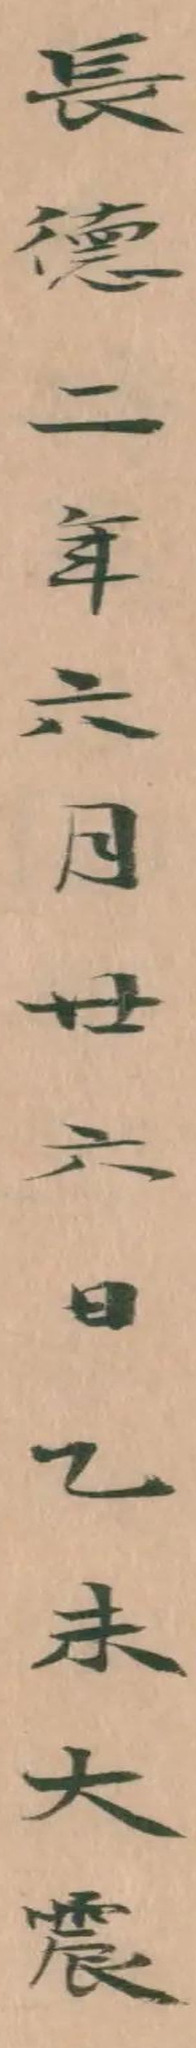長徳二年六月廿六日乙未大震
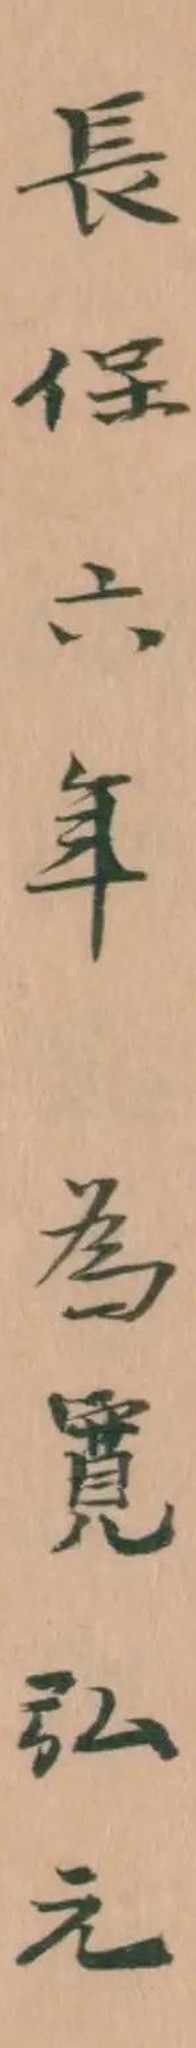長保六年為寛弘元
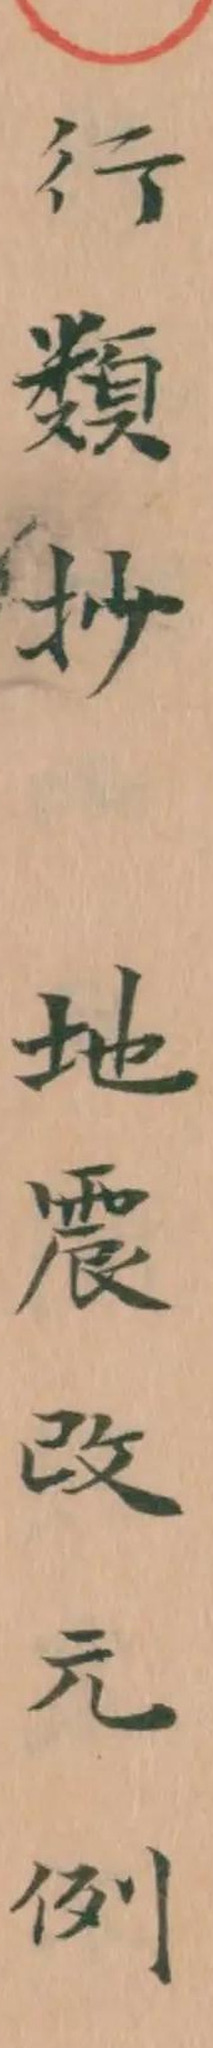○行類抄地震改元例
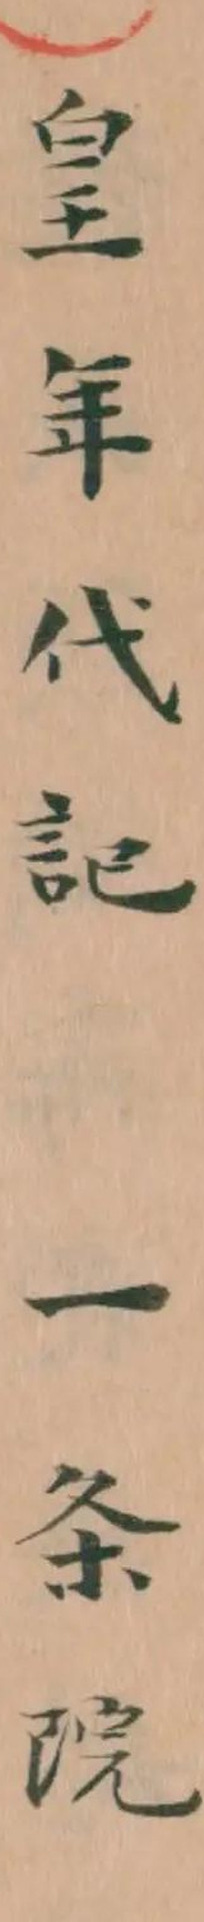○皇年代記一条院
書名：地災撮要. 巻5-6(地震之部)
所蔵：国立国会図書館 National Diet Library, JAPAN
